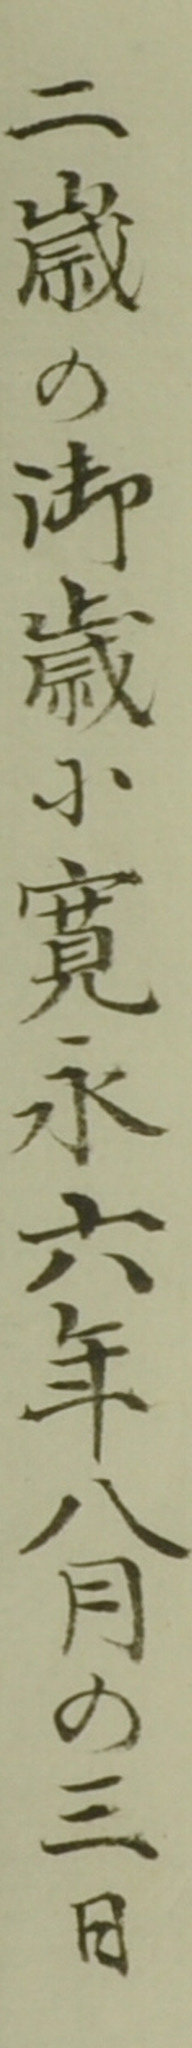二歳の御歳に寛永六年八月の三日
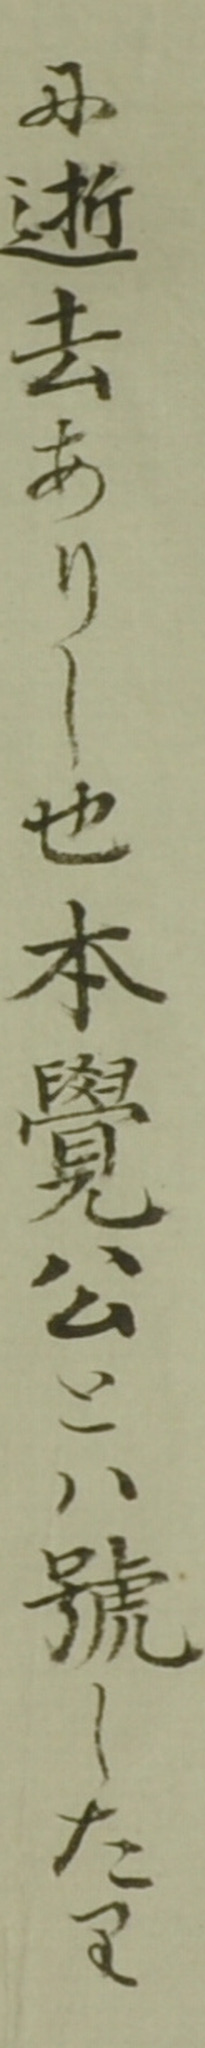に逝去ありし也本覺公とは號したり
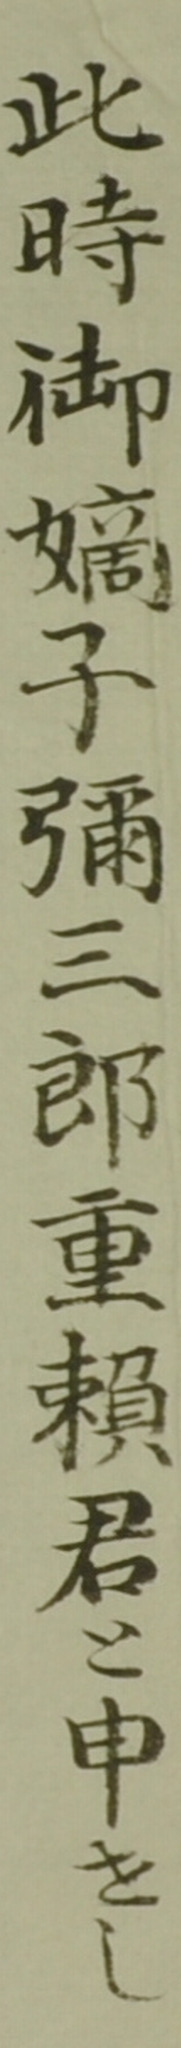此時御嫡子彌三郎重頼君と申せし
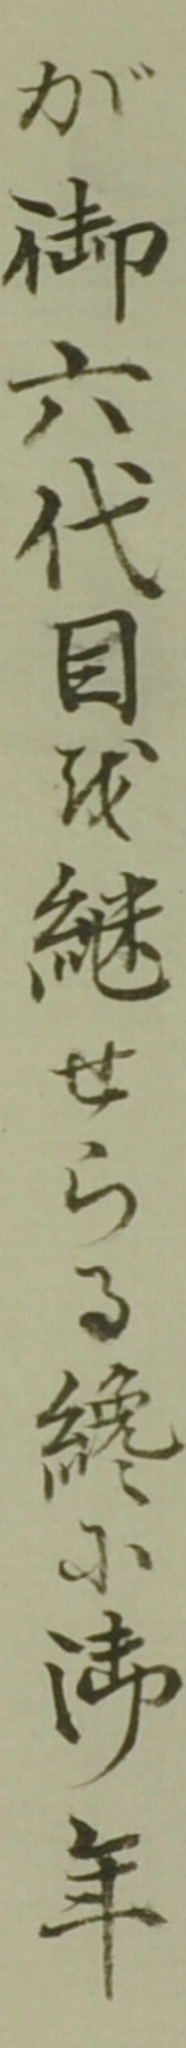が御六代目を継せらる纔に御年
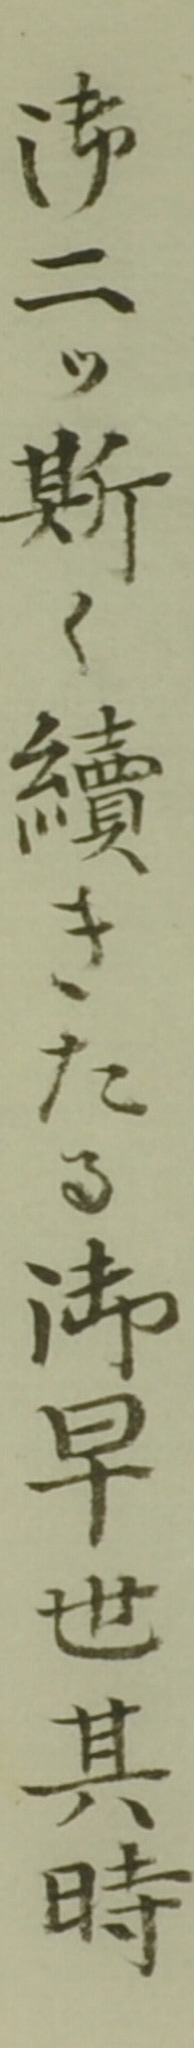御二つ斯く續きたる御早世其時
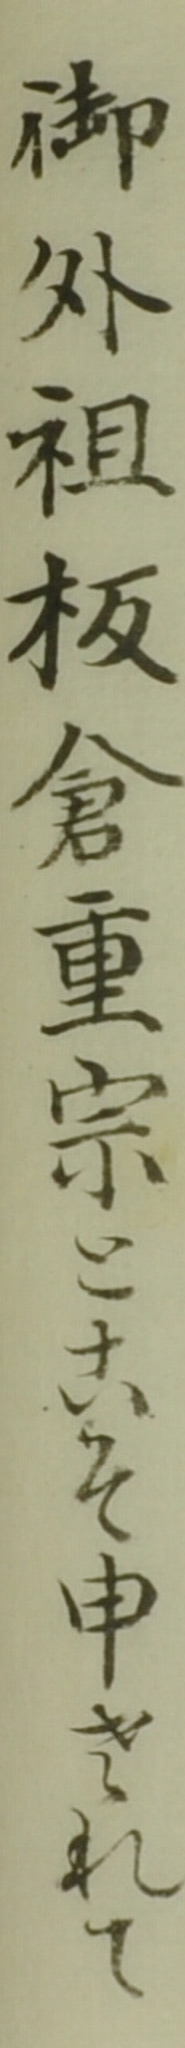御外祖板倉重宗とこそ申されて
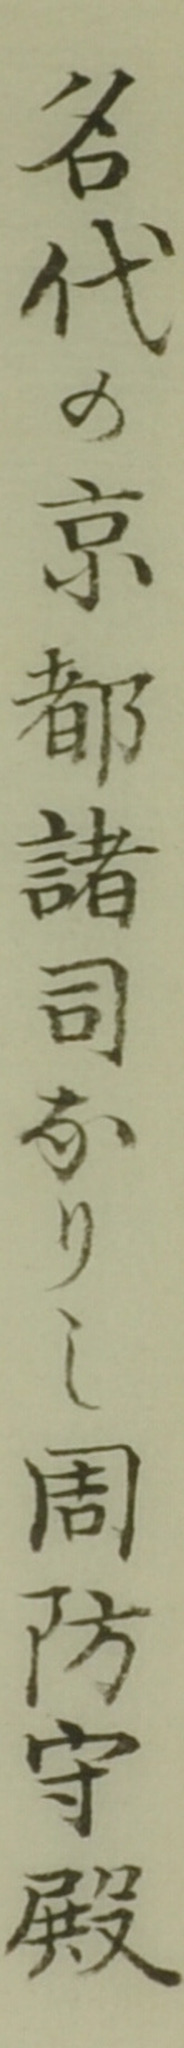名代の京都諸司なりし周防守殿
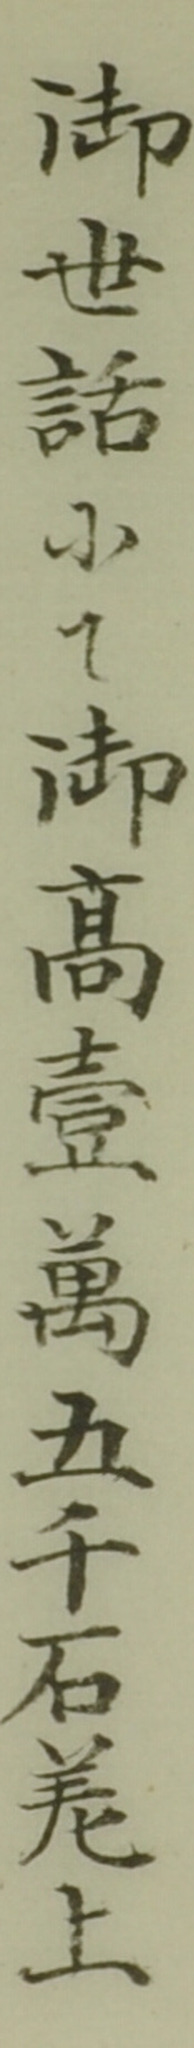御世話にて御高壹萬五千石差上
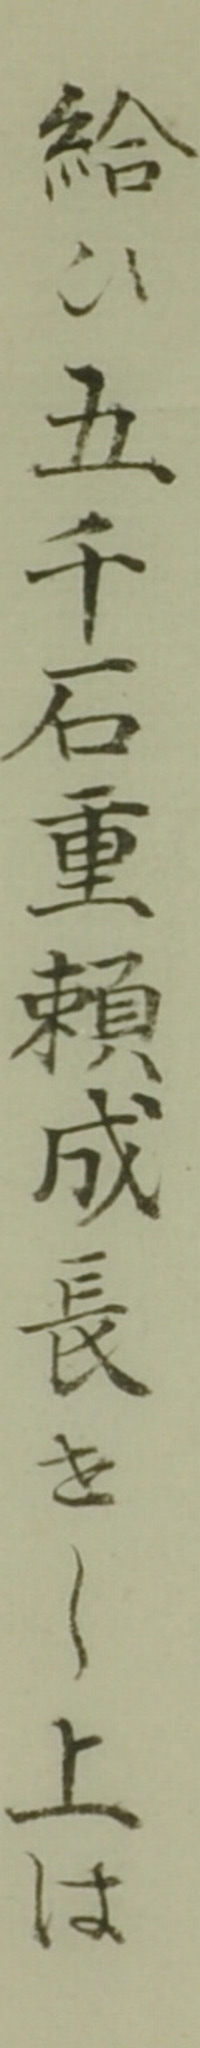給ひ五千石重頼成長せし上は
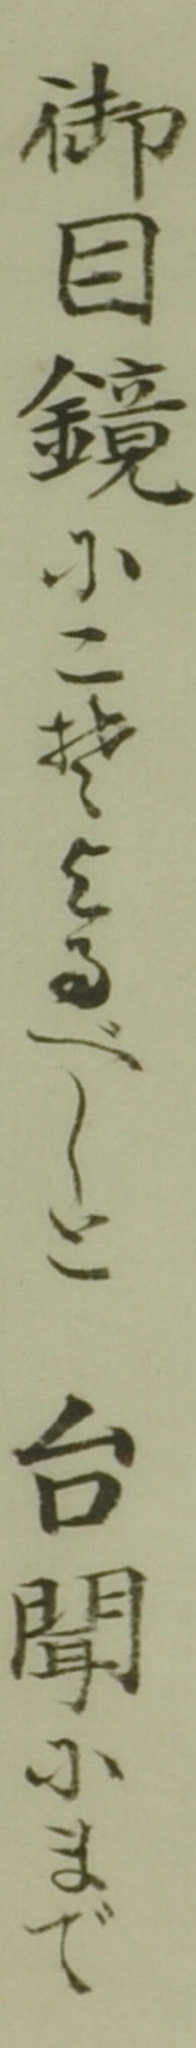御目鏡にこそよるべしと台聞にまで
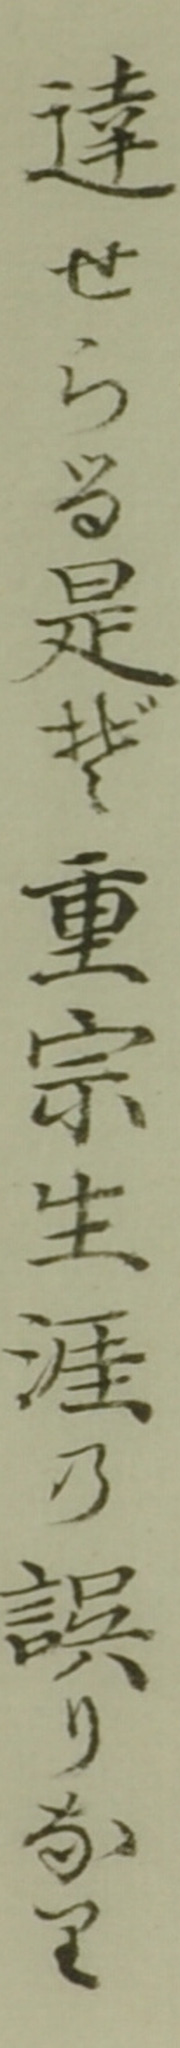達せらる是ぞ重宗生涯の誤りなり
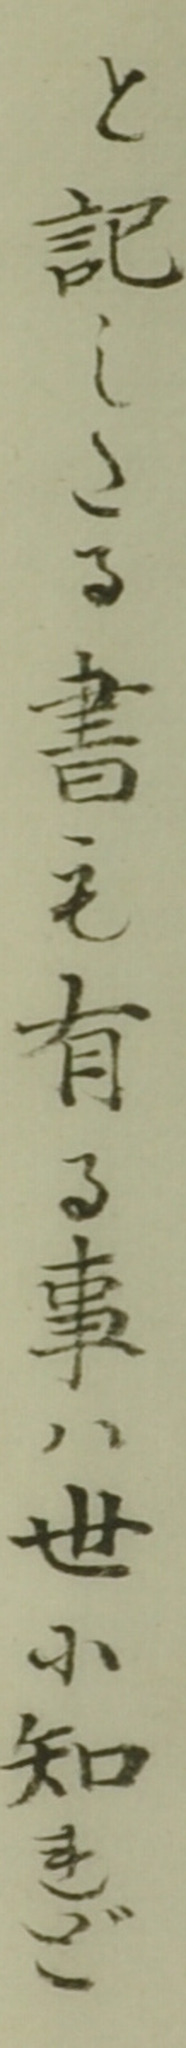と記したる書も有る事は世に知れど

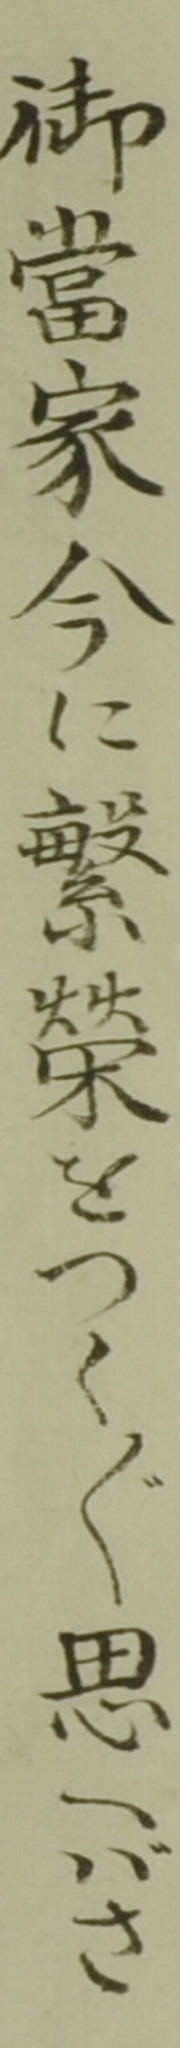御當家今に繁榮をつく〴〵思へばさ
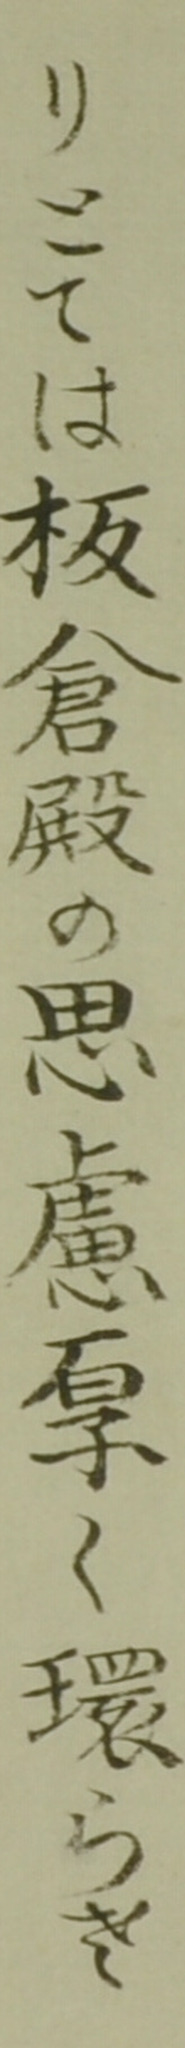りとては板倉殿の思慮厚く環らさ
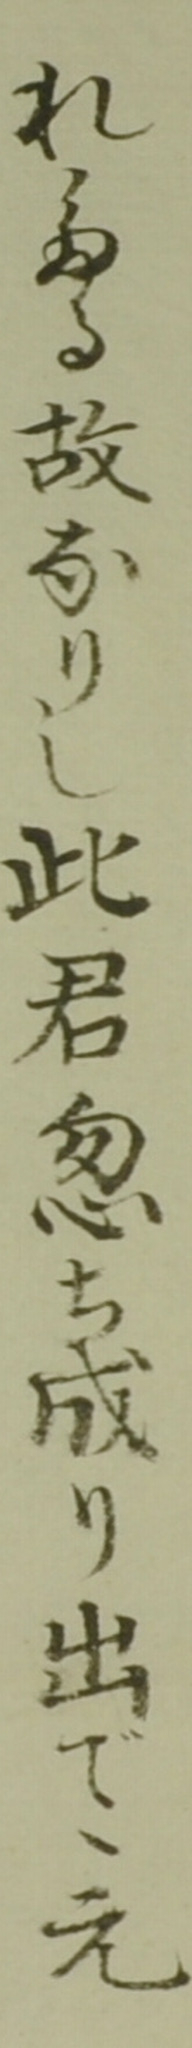れたる故なりし此君忽ち成り出てゝ元
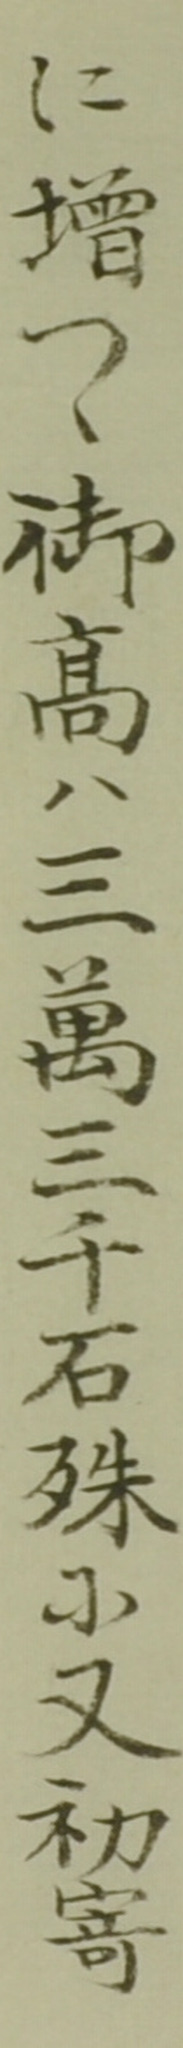に増つゝ御高は三萬三千石殊に又初寄
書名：藤葛（全）
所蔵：伊那市立高遠町図書館・合同会社AMANE
